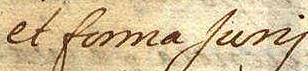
et forma Juris
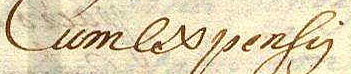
Cum expensis
